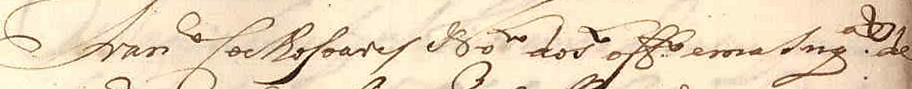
Franco Coelho Soares Notro do sto offo em a Inq.aõ de
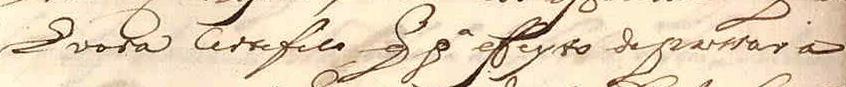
Evora Certefico q̄ pa effeyto de passar a
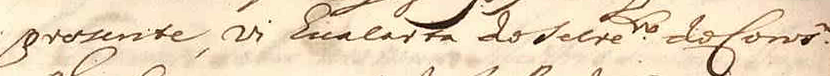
prezente, vi hua carta do Secretro. do Cons.o
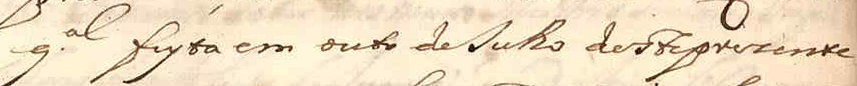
g.al feyta em outo de Iulho deste prezente
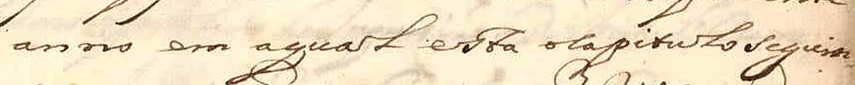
anno em a qual esta o capitulo seguim
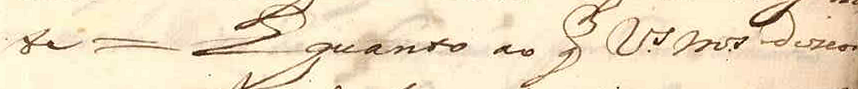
te = E quanto ao q̄ V.s m.s dizem
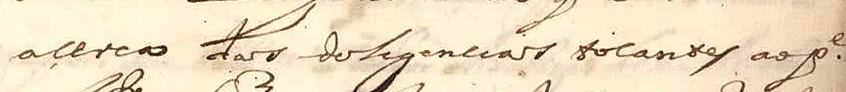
acerca das deligencias tocantes ao p.e
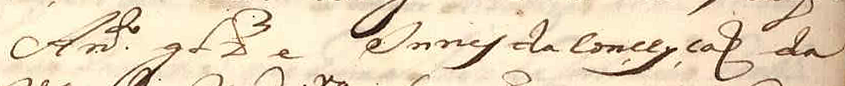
An.to glz̄ e Innes da Conceyçaõ da
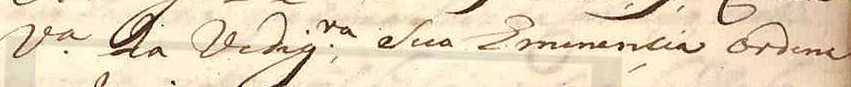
V.a da Vidig.ra Sua Eminencia ordena
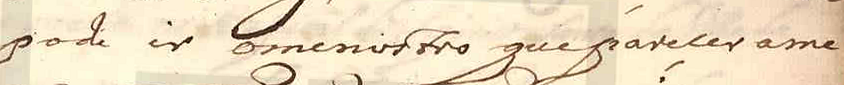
pode ir o menistro que parecer a me
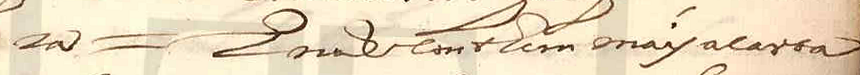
za = E naõ conthem mais a carta
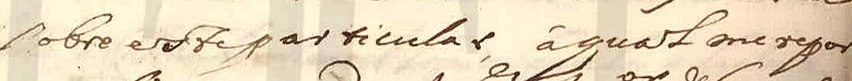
sobre este particular, á qual me repor
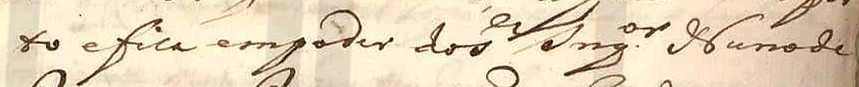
to, e fica em poder do sor Inq.or Nuno de
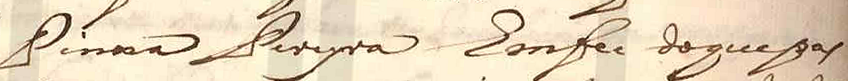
Pinna Pereyra Em fee do que pas
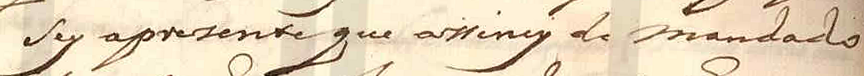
sey a prezente que assiney de mandado
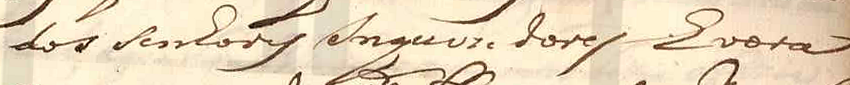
dos Senhores Inquizidores Evora
